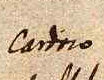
cardozo
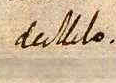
de Melo.
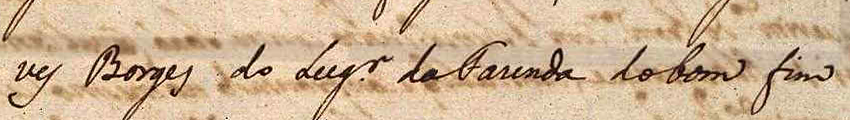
ves Borges do Lug.r da Fazenda do bom fim
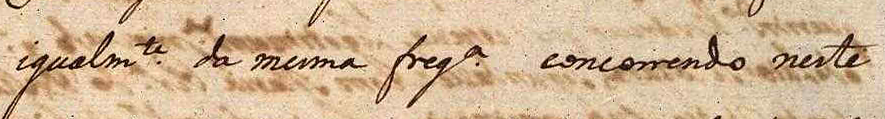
igualm.te da mesma freg.a concorrendo neste
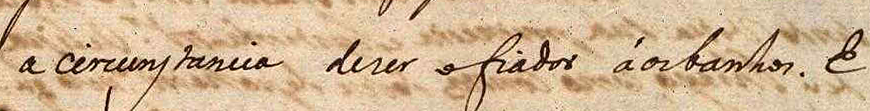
a circunstancia de ser o fiador áos banhos. E
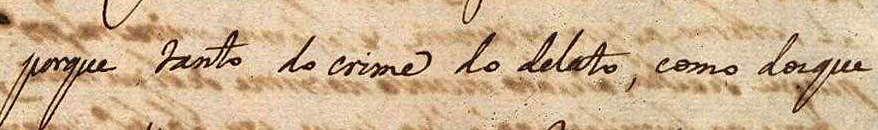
porque tanto do crime do delato, como dos que
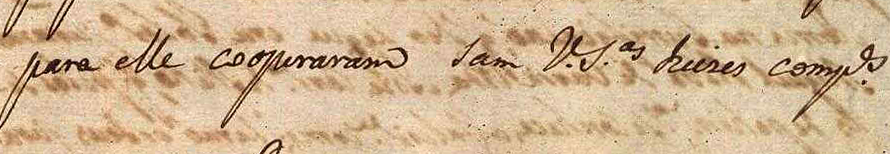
para elle cooperaram sam V. S.as Iuizes comp.es
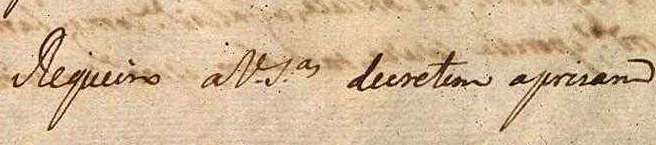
Requeiro a V.S.as decretem a prizam
